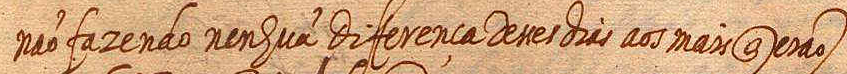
naõ fazendo nenhuā differença desses dias aos mais q̄ erão
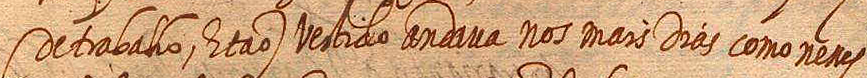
de trabalho, E tão vestido andaua nos mais dias como nesses
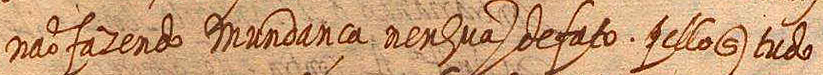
não fazendo mundança nenhuā de fato. pello q̄ tudo
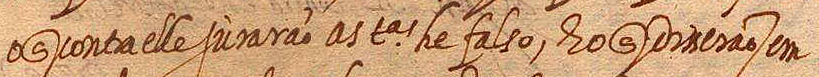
o q̄ contra elle jurarão as tas. he falso, E o q̄ disserão em
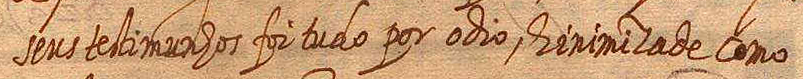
seus testimunhos foi tudo por odio, E inimizade como
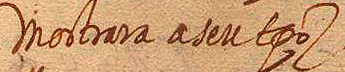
mostrara a seu tpō.
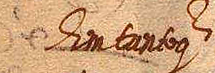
Em tanto q̄
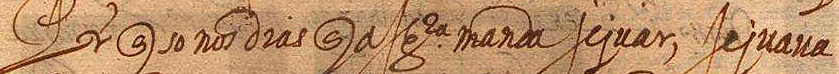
Porq̄ so nos dias q̄ a Jgra manda jejuar, jejuaua
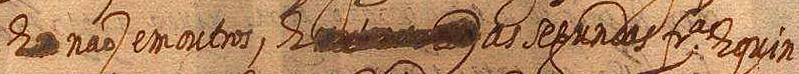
E não em outros, E _ as segundas fras. E quin
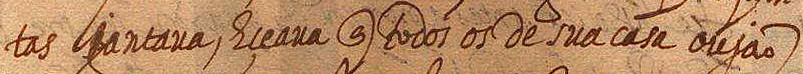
tas jantaua, E ceaua q̄ todos os de sua casa o ujão
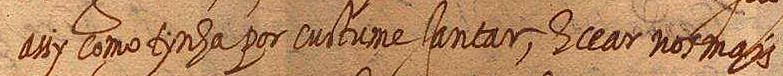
assy como tynha por custume Jantar, E cear nos mais
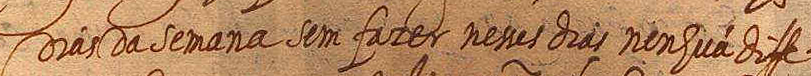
dias da semana sem fazer nesses dias nenhuā diffe
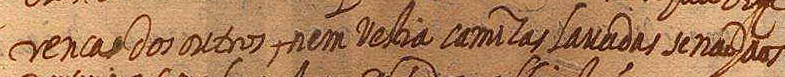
rença dos outros, nem vestia camizas lauadas senão aos
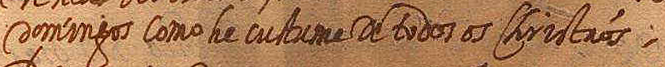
domingos como he custume de todos os Christãos.
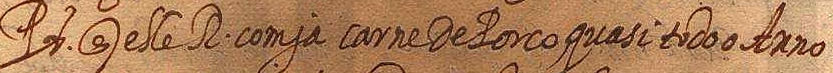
Porq̄ elle R. comja carne de Porco quasi todo o Anno
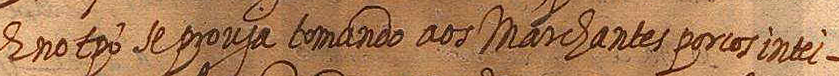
E no tpō se prouja tomando aos marchantes porcos intei
